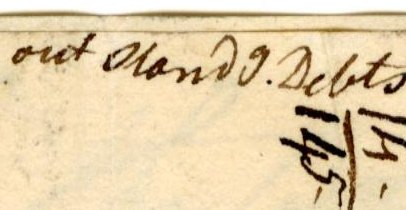out standg. Debts
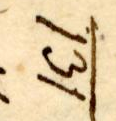131
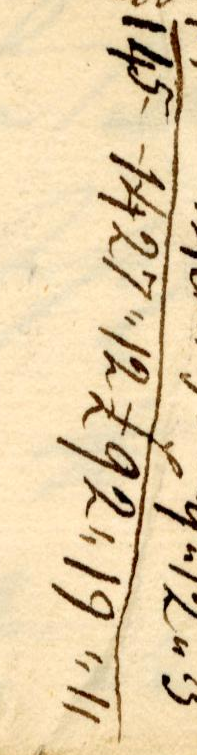145- -1427.. 12 £92.. 19.. 11
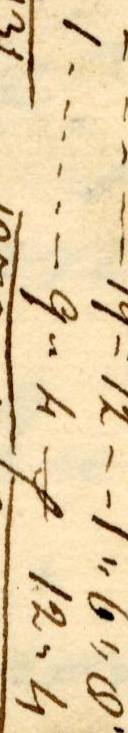1- - - - - - 9.. 4 12.. 4
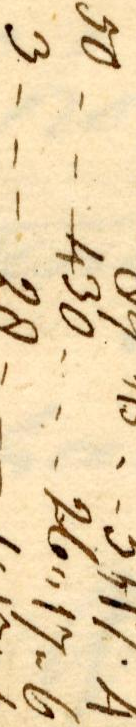50 - - - 430 - - - 26.. 17.. 6
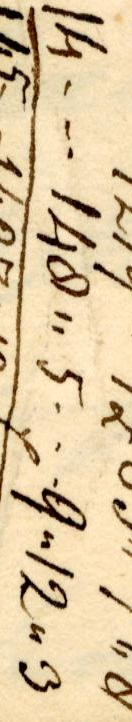14- -- 148.. 5- - -9.. 12.. 3
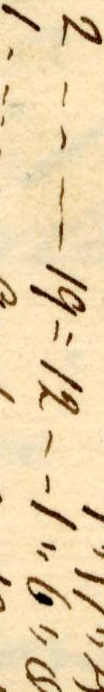2 - - - - 19 =12 - - 1.. 6.. 8
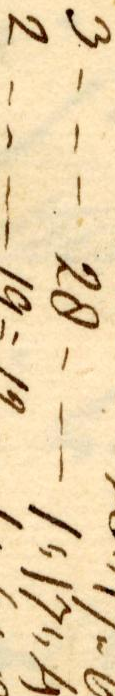3 - - - 20 - - - 1.. 17.. 4
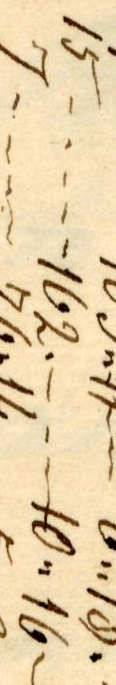15 - - - - - 162.- - - 10.. 16
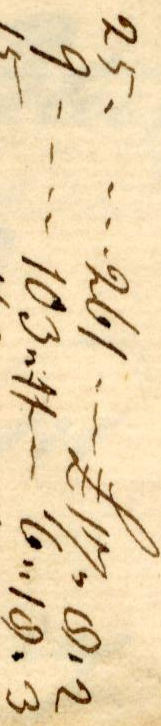25- - - -261- - -£17.. 8.. 2
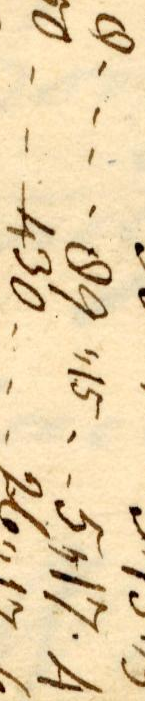8 - - - - 89.. 15 - - 5.. 17 4
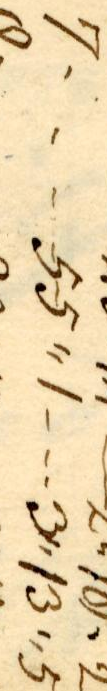7 - - -5-5.. 1- - - 3.. 13.. 5
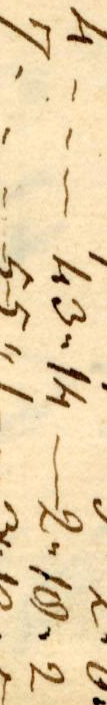4 - - - 43.. 14.- 2.. 10.. 2
